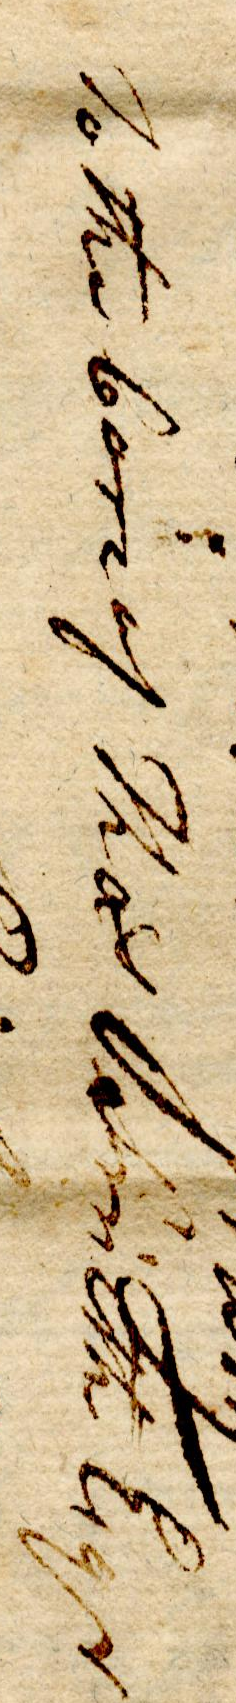To the Care of Tho^s Smith Esq^r
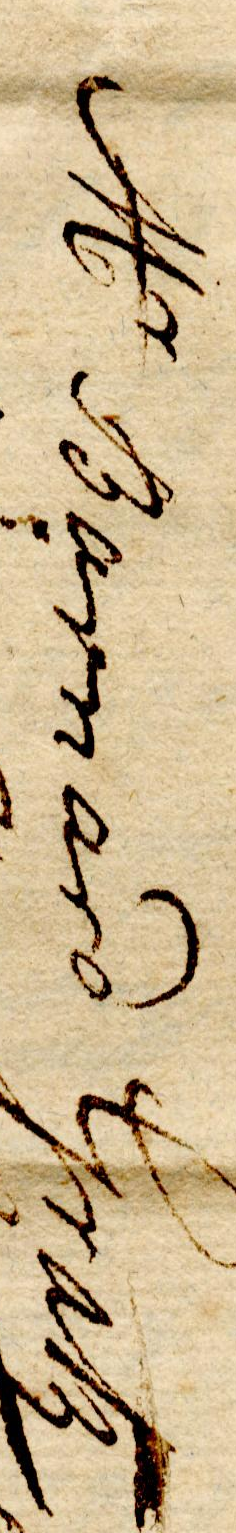M^r Barnard Gratz
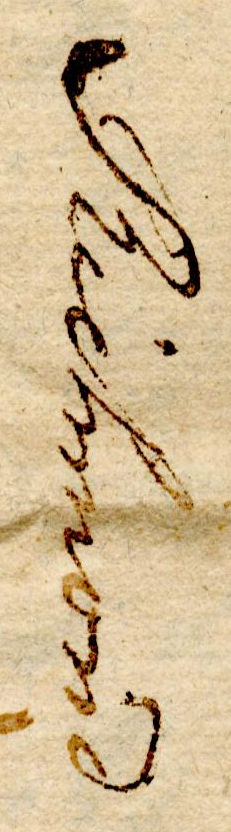Richmond
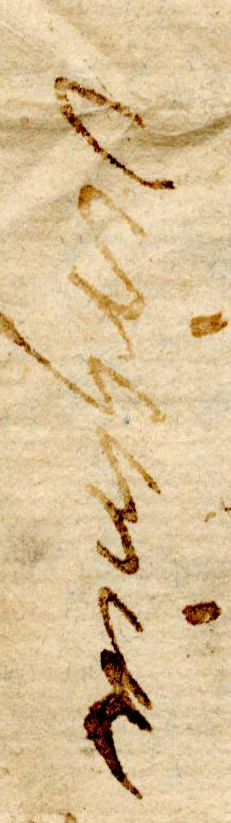Virginia
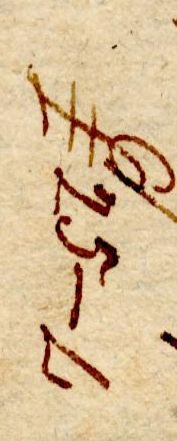£ 25-4
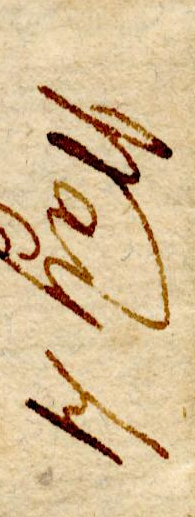Way 4
